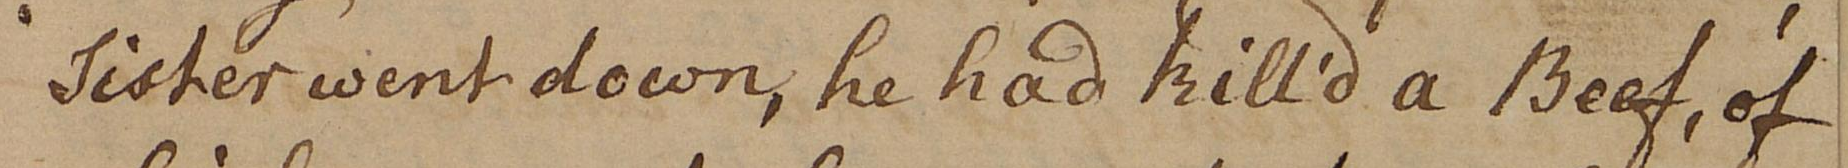Sister went down, he had kill'd a Beef, of
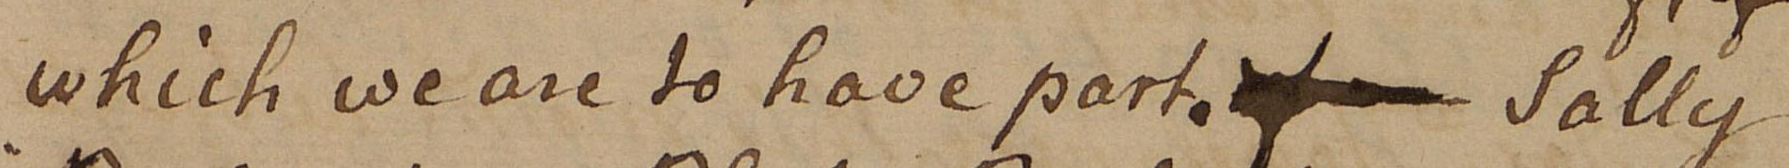which we are to have part. [__] Sally
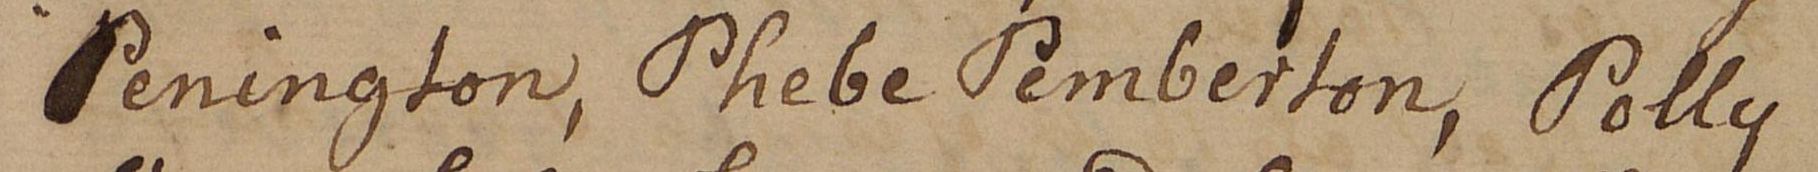Penington, Phebe Pemberton, Polly
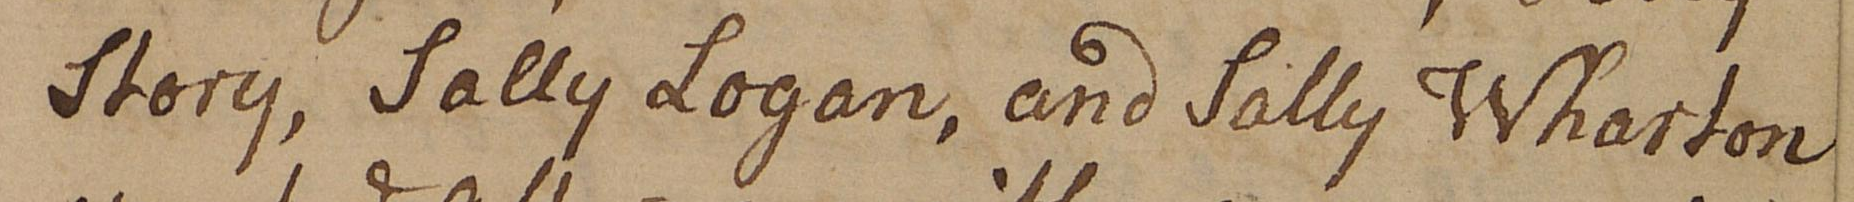Story, Sally Logan, and Sally Wharton
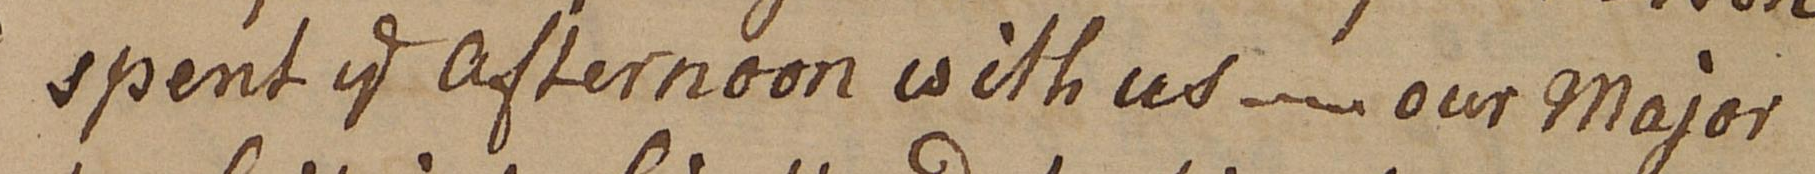spent y^e afternoon with us- our Major
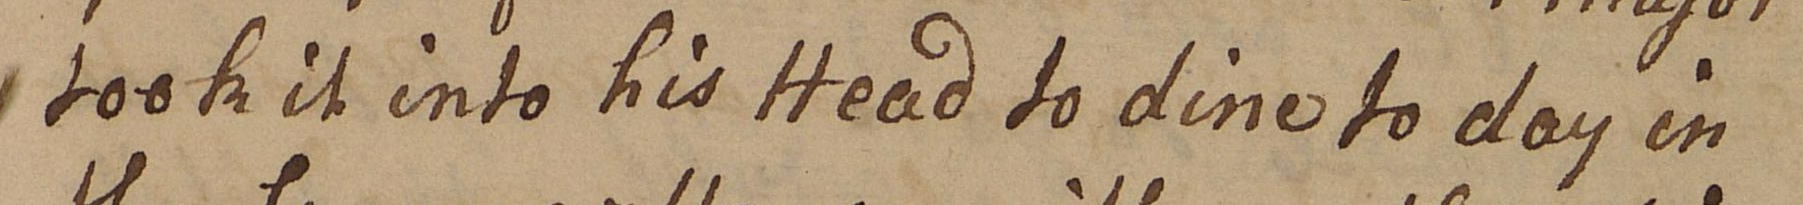took it into his Head to dine to day in
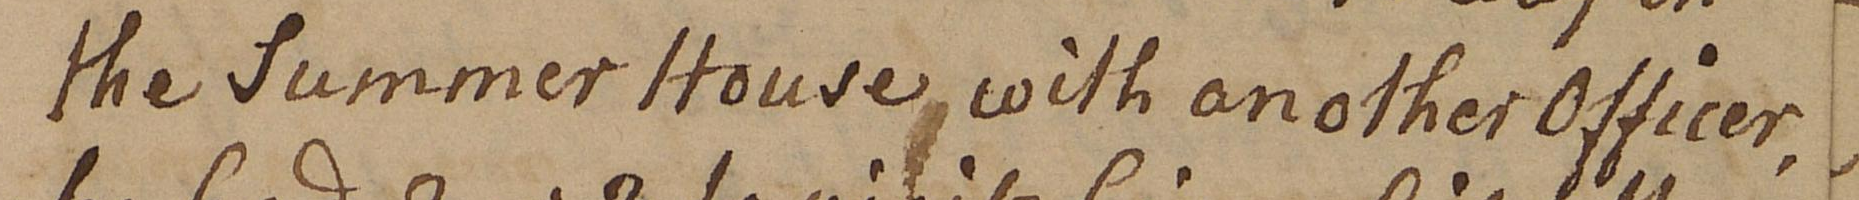the Summer House with another Officer,
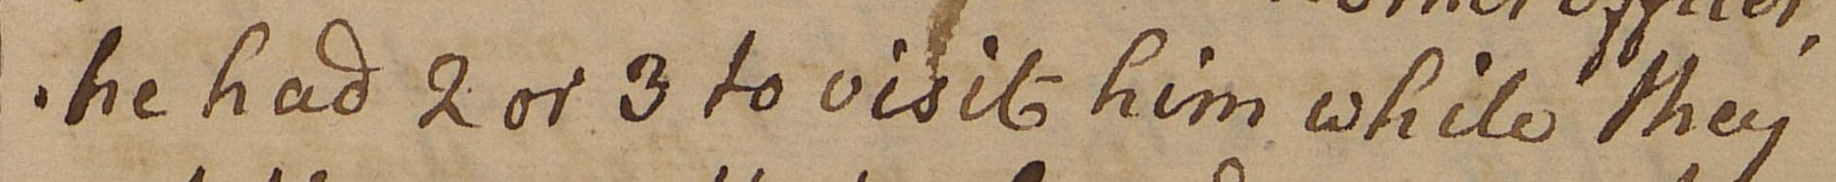he had 2 or 3 to visit him while they
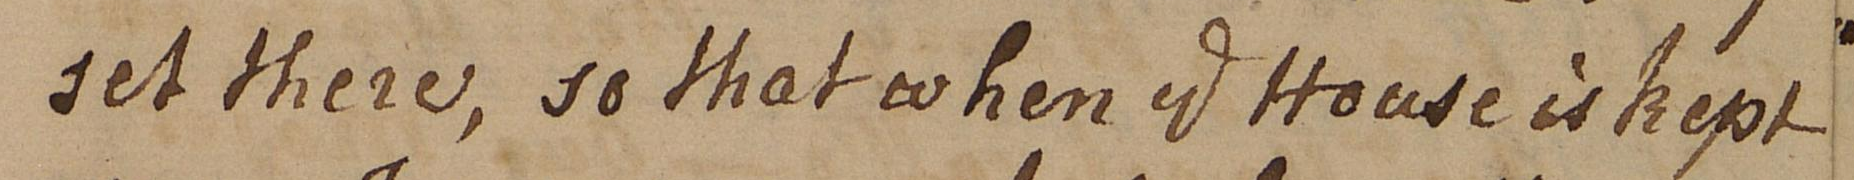set there, so that when y^e House is kept
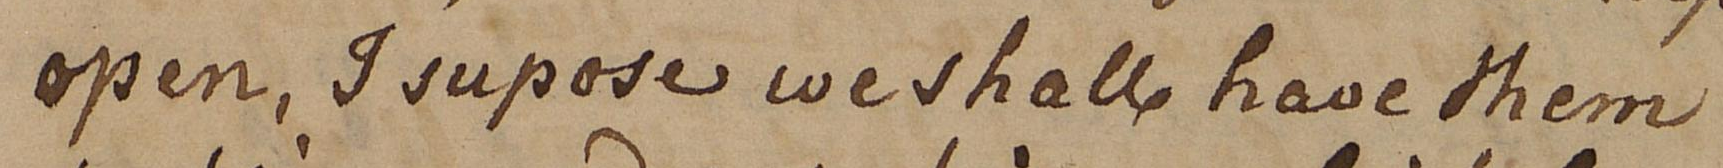open, I supose we shall have them
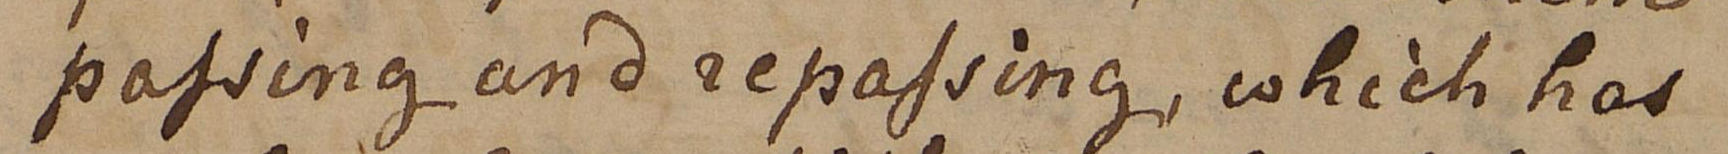passing and repassing, which has
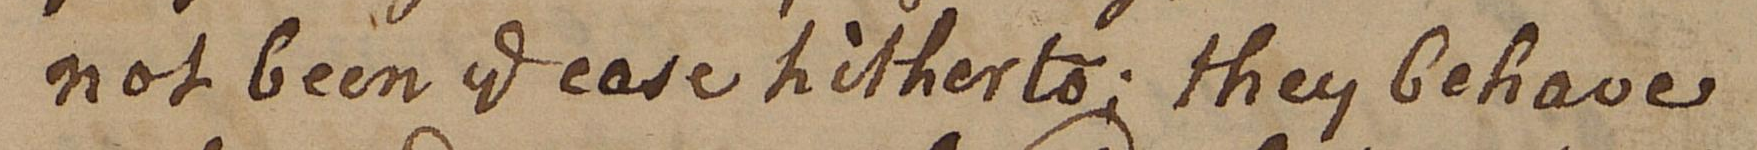not been y^e case hitherto; they behave
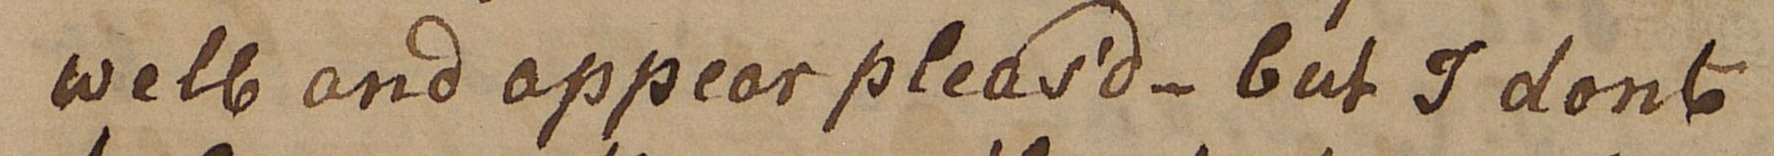well and appear pleas'd- but I dont
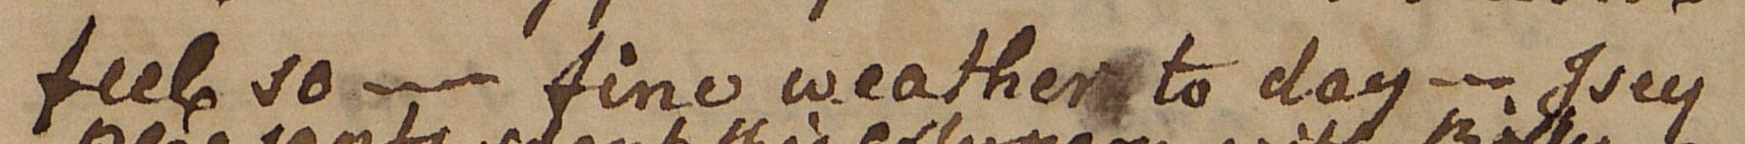feel so- fine weather to day-- Isey
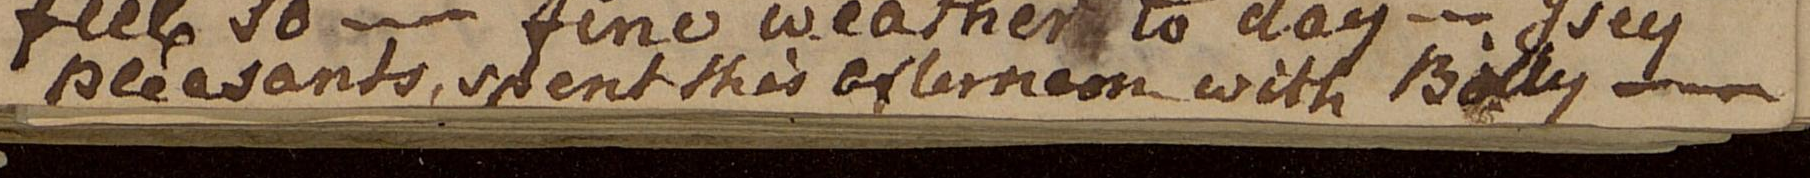Pleasants, spent this afternoon with Betty-
